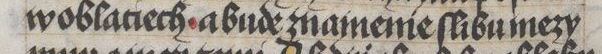w oblaciech.a bude znameníe ſlibu mezy
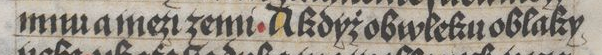mnu a mezi zemi.A kdyż obwleku oblaky
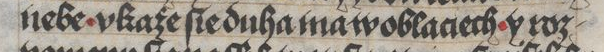nebe.vkaże ſie duha ma w oblaciech.y roz¬
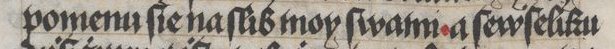pomenu ſie na ſlib moy ſwamí.a ſewẛeliku
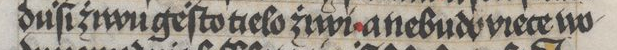duẛi żiwu geẛto tielo żiwí.a nebudy víece wo¬
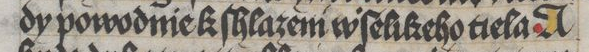dy powodnie k ſhlazení wẛelikeho tiela.A
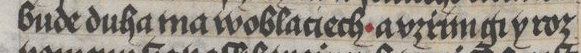bude duha ma woblaciech.a vzṙím gi y roz¬
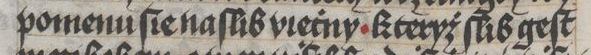pomenu ſie naſlib vieċny.kteryż ſlib geſt
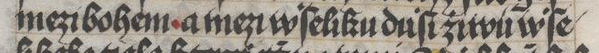mezi bohem.a mezi wẛeliku duẛi żiwú wẛe¬
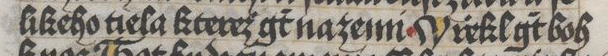likeho tiela ktereż ḡt nazemi.Y ṙekl ḡt boh
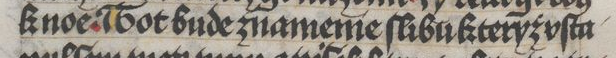knoe.Tot bude znamenie ſlibu kteryż vſta¬
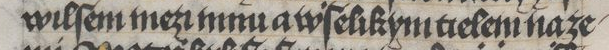wilſem mezi mnu a wẛelikym tielem na ze¬
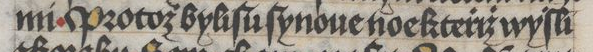mi.Protoż byli ſu ſynoue noe kteṙiż wyẛl̇i
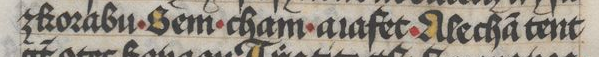zkorabu.Sem.cham.a iaſet. Ale chā tent¬
